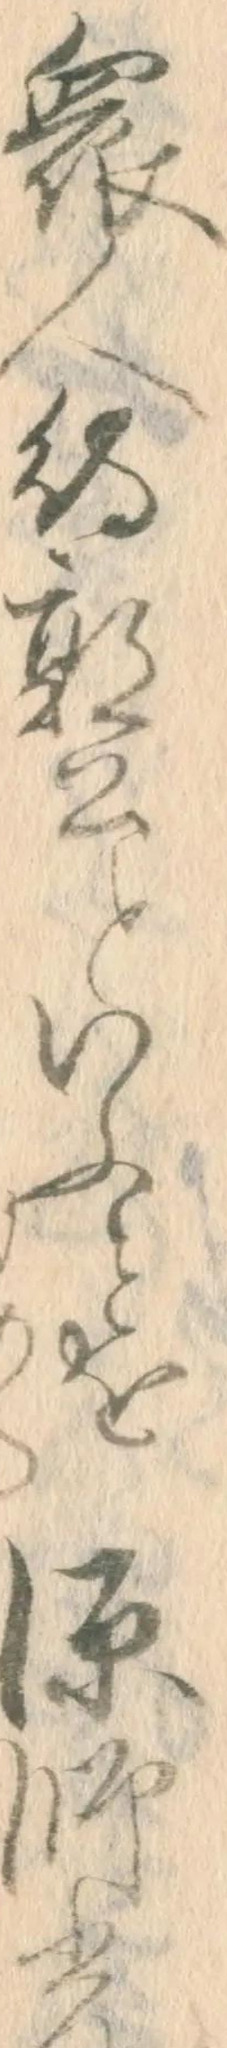衆人待郭公といふことを原師光
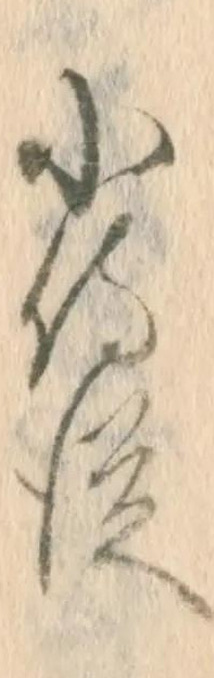小侍従
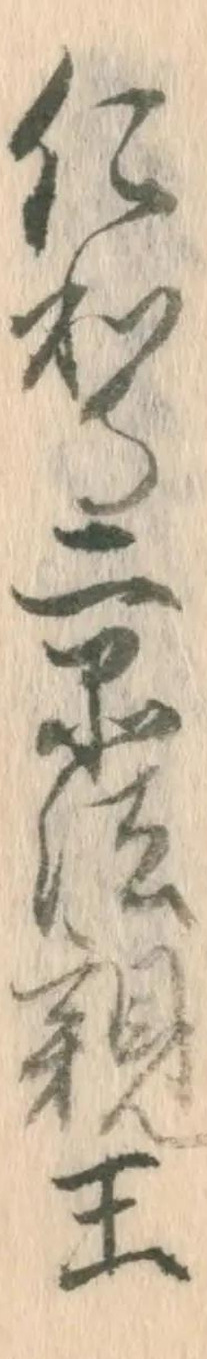郭公仁和二品法親王
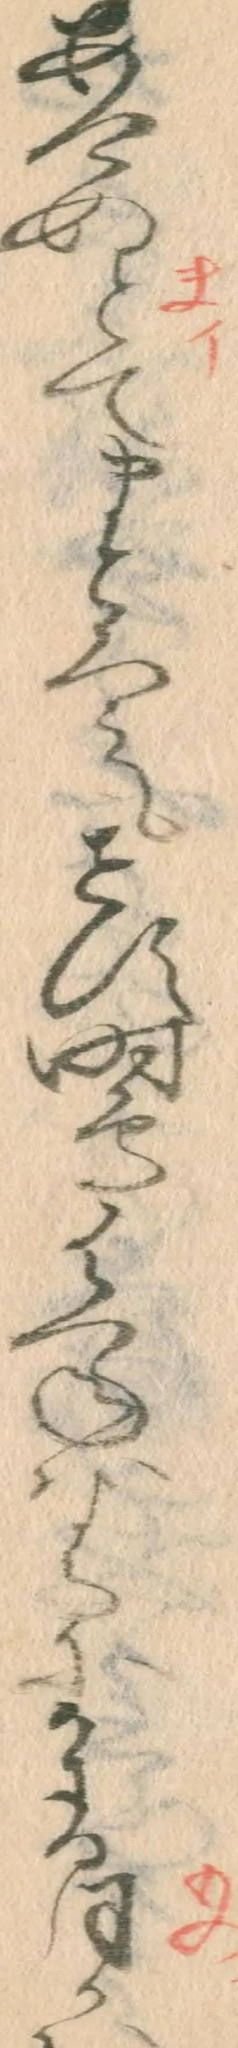あけぬとてまとろみもせす時鳥はつねはよるにかきる月かは
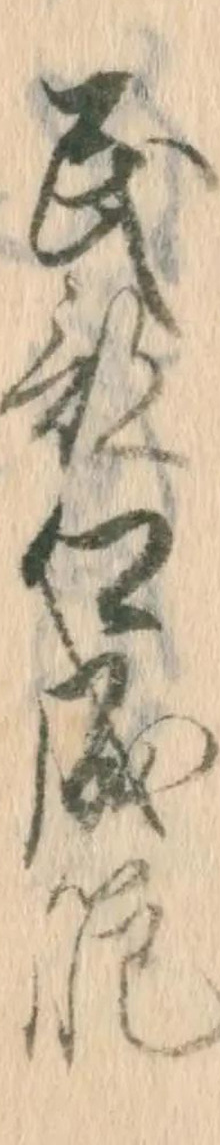民部卿成範
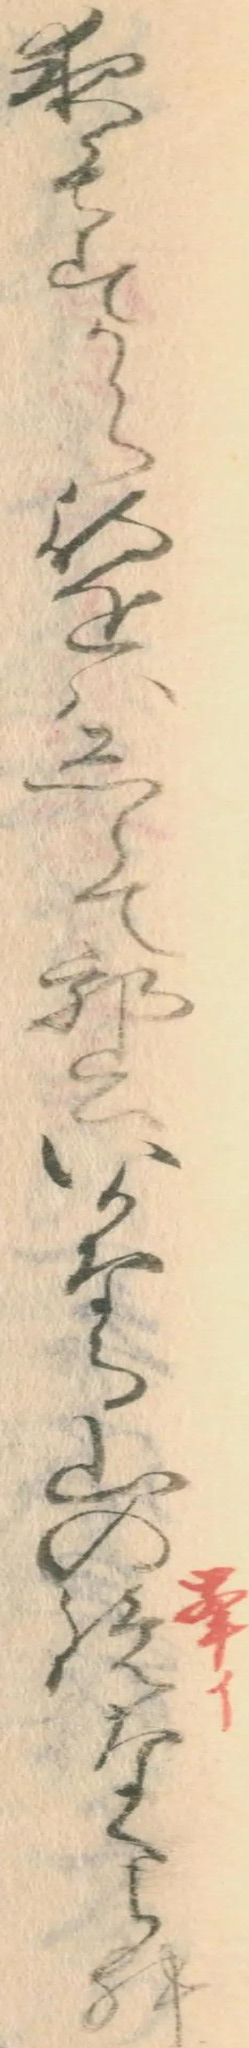夜もすから待をはしらて郭公いかなる山の鏡なくらむ
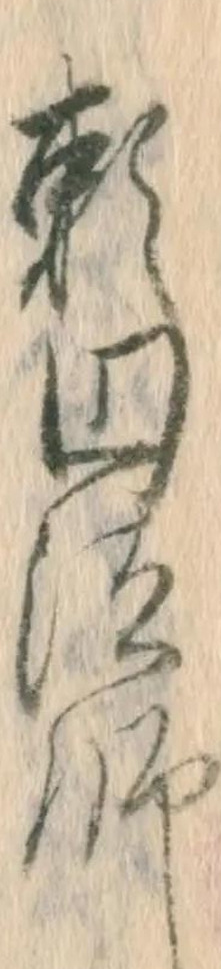頼円法師
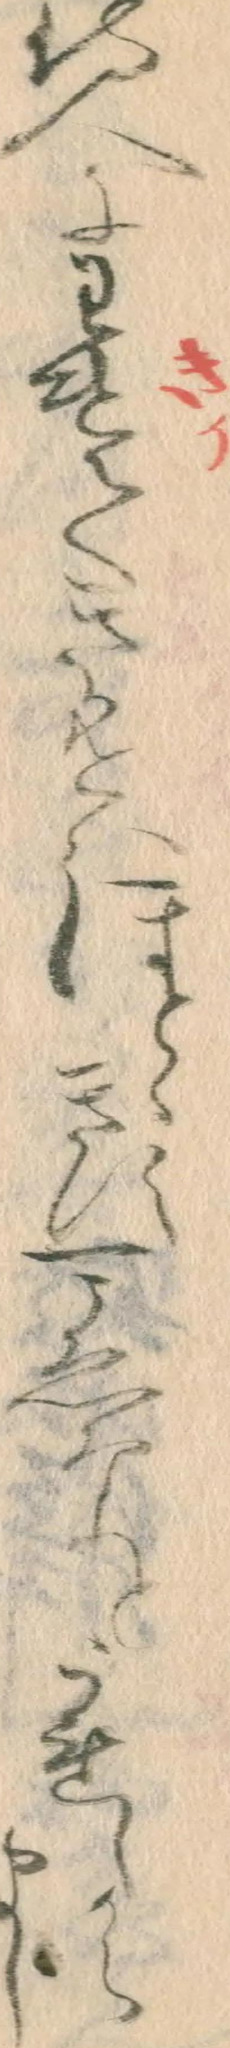待人にわけてきかせはほとゝきす一こゑなりとうれしからまし
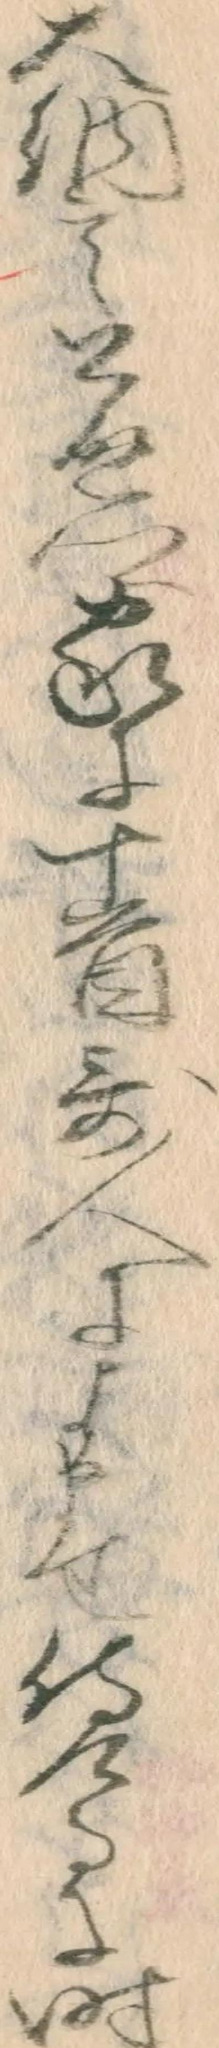大納言之公通卿家に十首歌人によませ侍けるに時
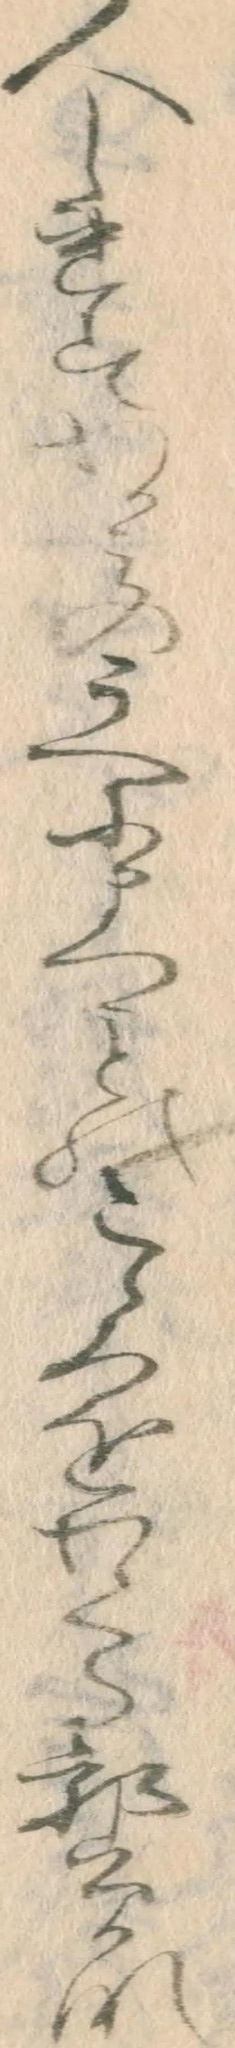人しれすわかみのうへにまつことのこゝろをわくる郭公かな
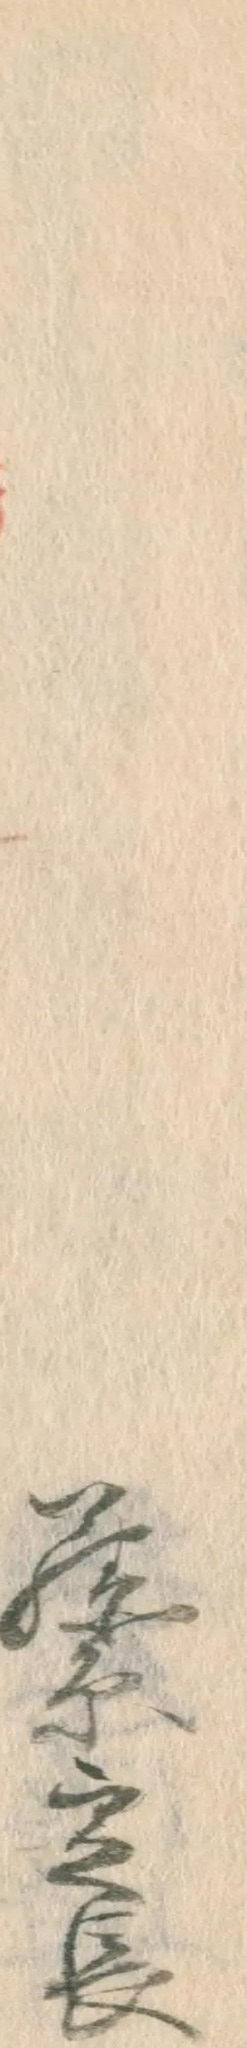藤原定長
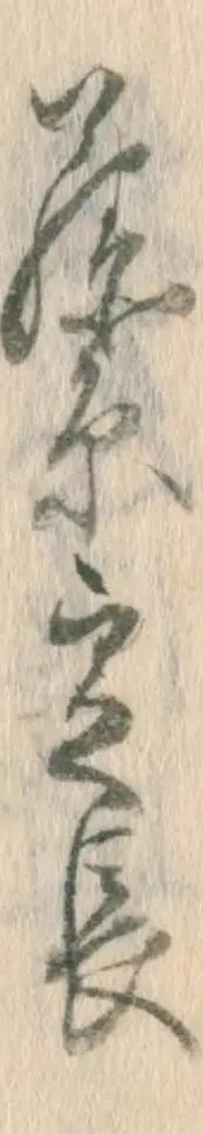藤原定長
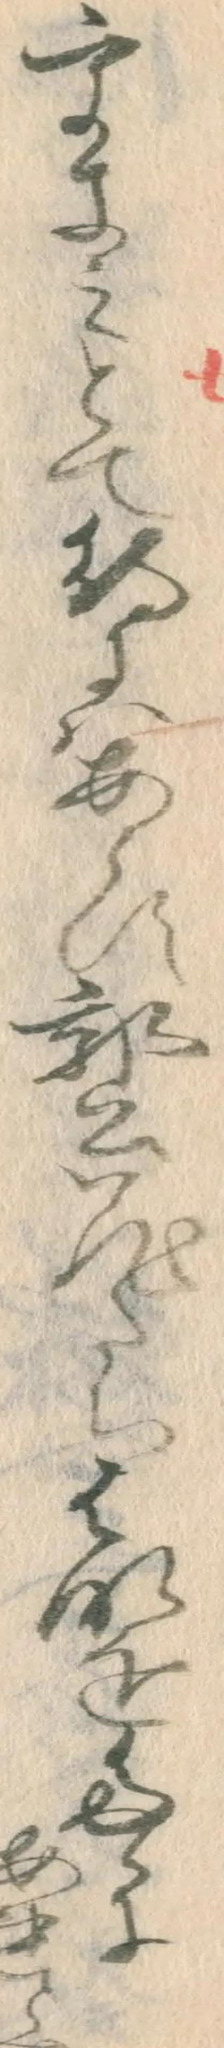うきみとて待にはあらす郭公花たちはなをたゝにあれとや
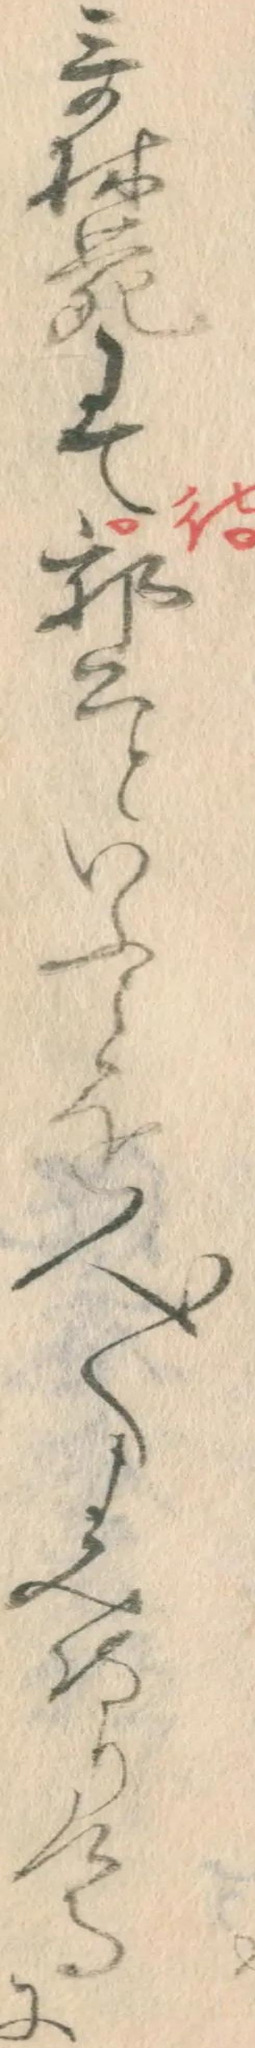歌林苑にて◦郭公といふことを人〳〵よみ侍りけるに
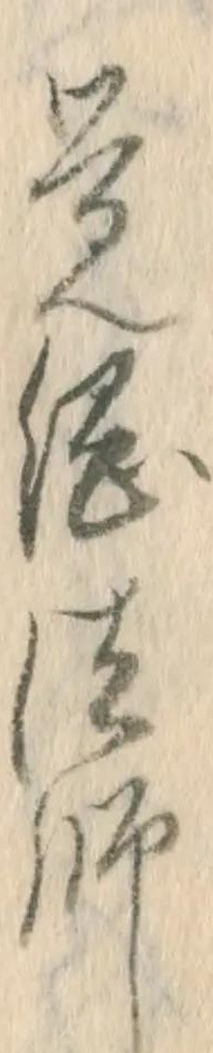覚綱法師

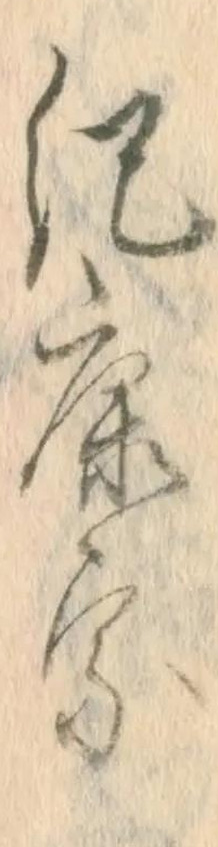紀康宗
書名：月詣和歌集
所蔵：国立国会図書館 National Diet Library, JAPAN
